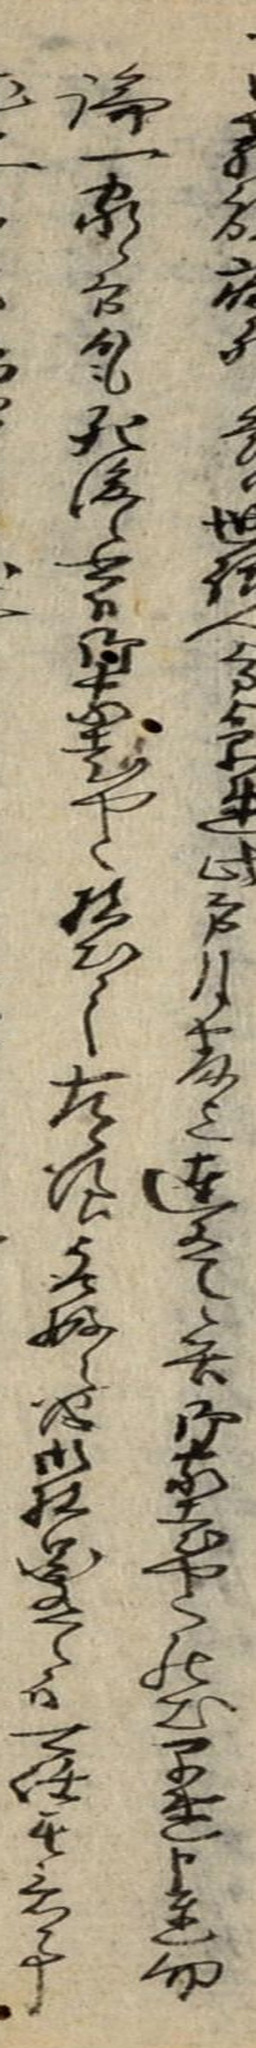論一家之方ゟも死後之書付御家老中へ指出し左候得は取扱之儀御指図有之に付可任其意事
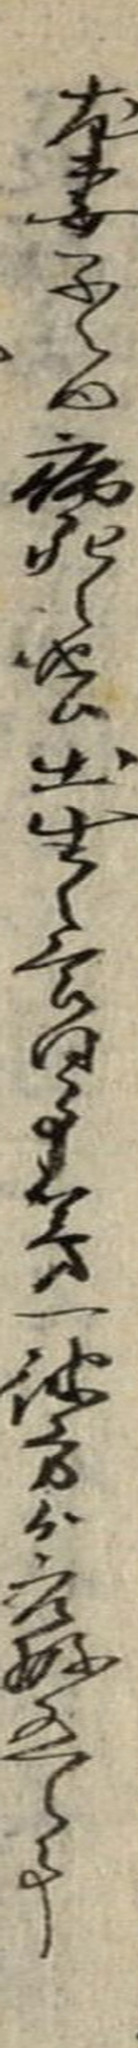尤妻子之内病死之儀は出生之節同事第一彼方ゟ取扱有之事
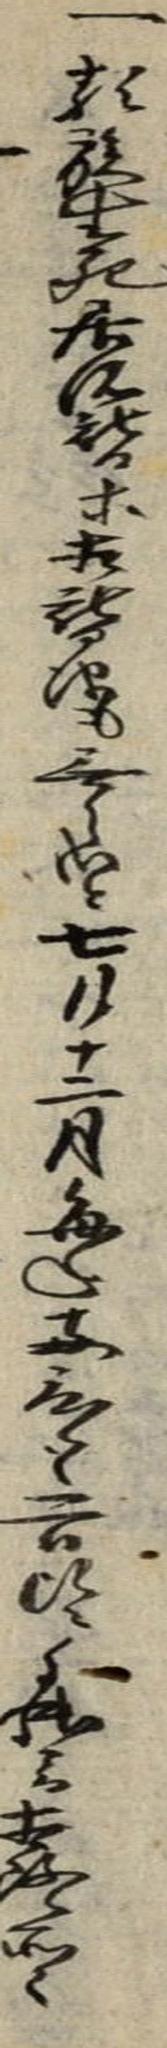一類族生死居所替等相替儀も無之哉と七月十二月毎年両度ツヽ二日頃に手紙にて相改候所々
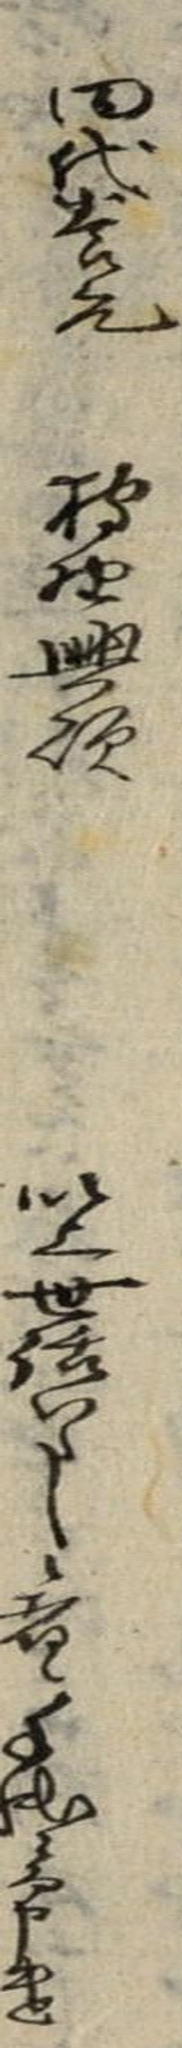田代養元狩野興碩以上世話いたし候者へ手紙にて申遣
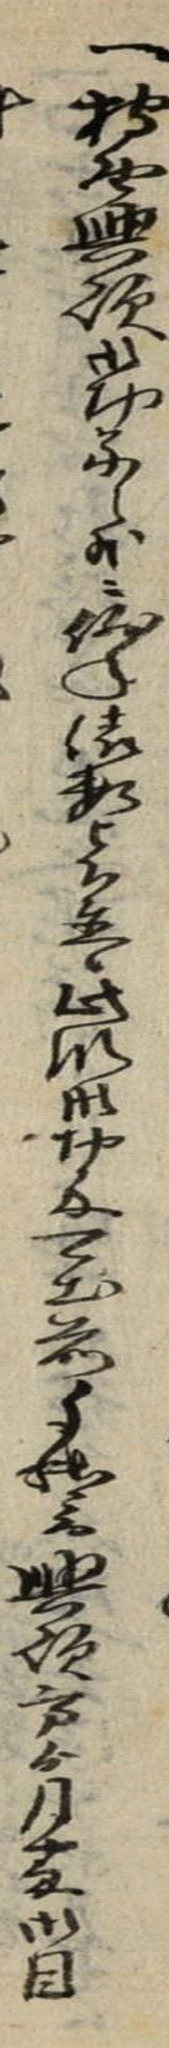一狩野興碩御切米之外に例年俵数被下置候此段御切米可出前手紙にて興碩方ゟ月番御目
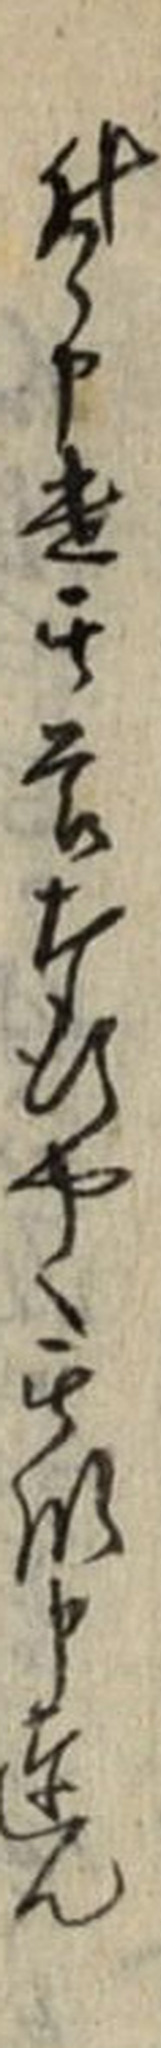付へ申遣其節奉行中へ其段申達ル
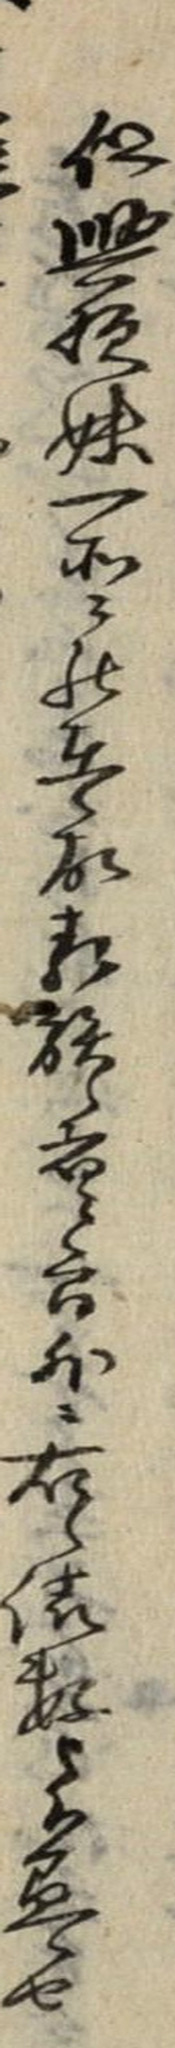但興碩妹一所に罷在候故類族之者に候間外に右之俵数被下置候由
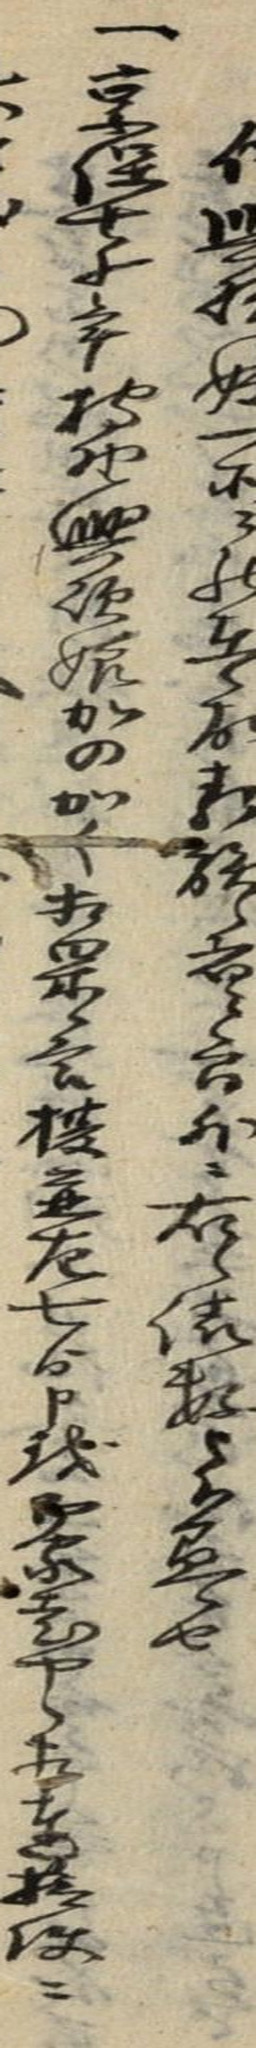一享保七刁年狩野興碩娘かのかく相果候節榎並左七ゟ申越御家老中へ相達検使に
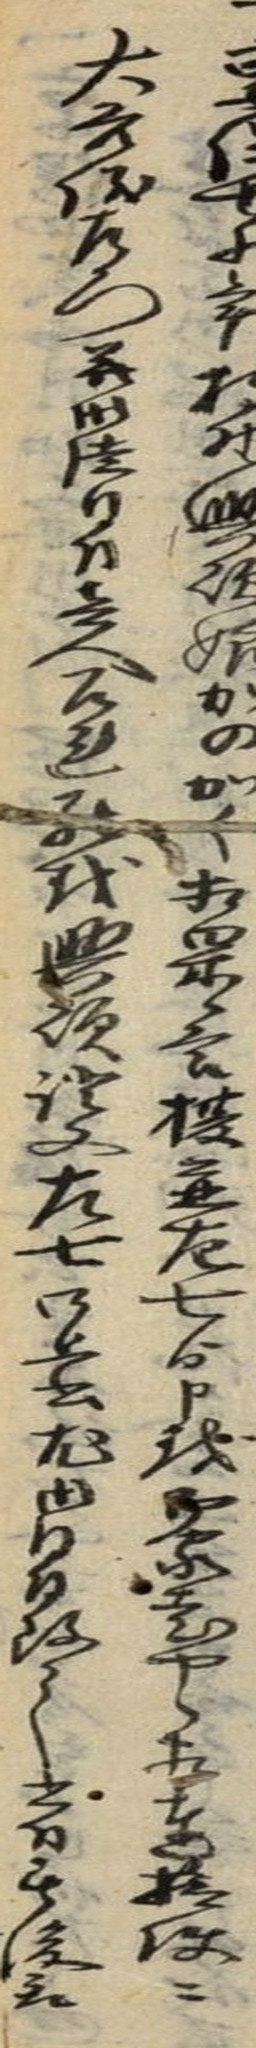大谷儀左衛門并御徒目付壱人召連罷越興碩証文左七口上書尤御目付改之書付其後取
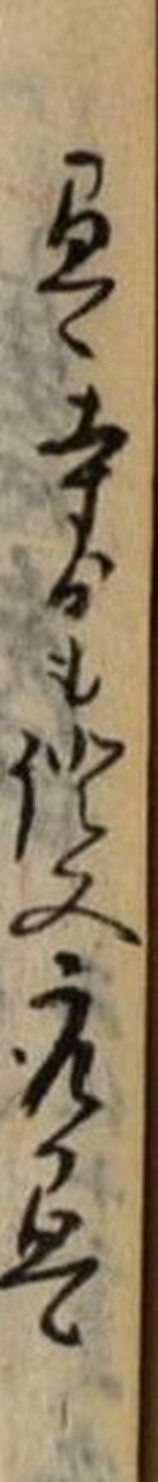置候寺ゟも証文取置候
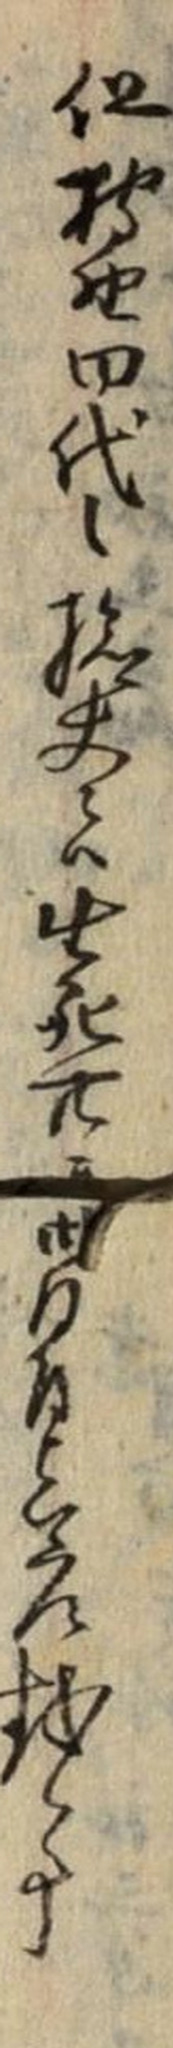但狩野田代之検使には生死共に御目付迄差越候事
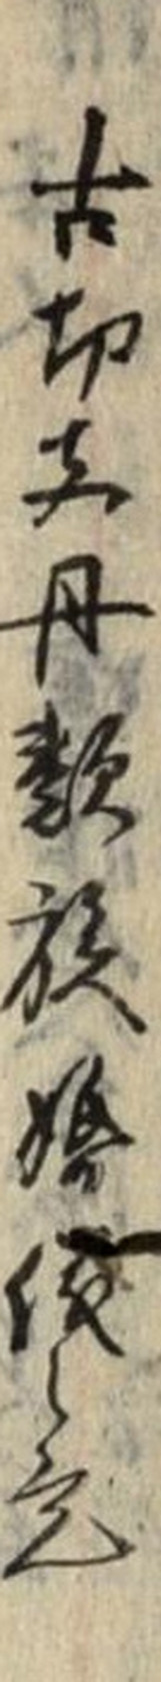古切支丹類族婚儀之覚
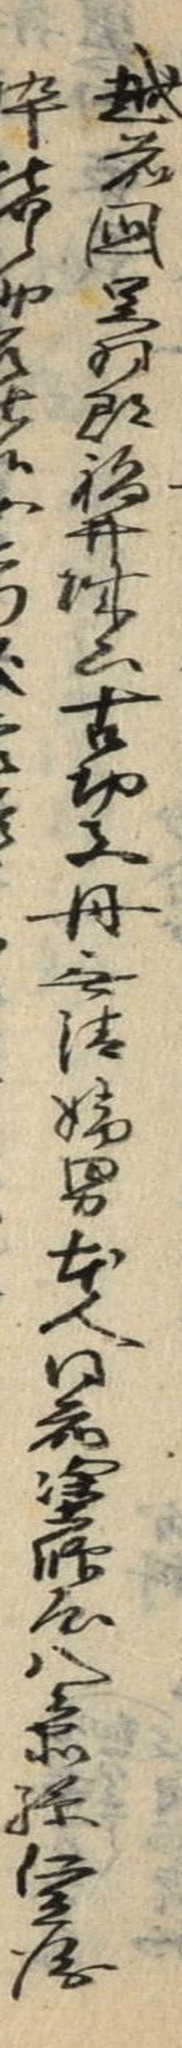越前国足羽郡福井城下古切支丹無請嫡男本人同前塗師屋八兵衛孫仁兵衛
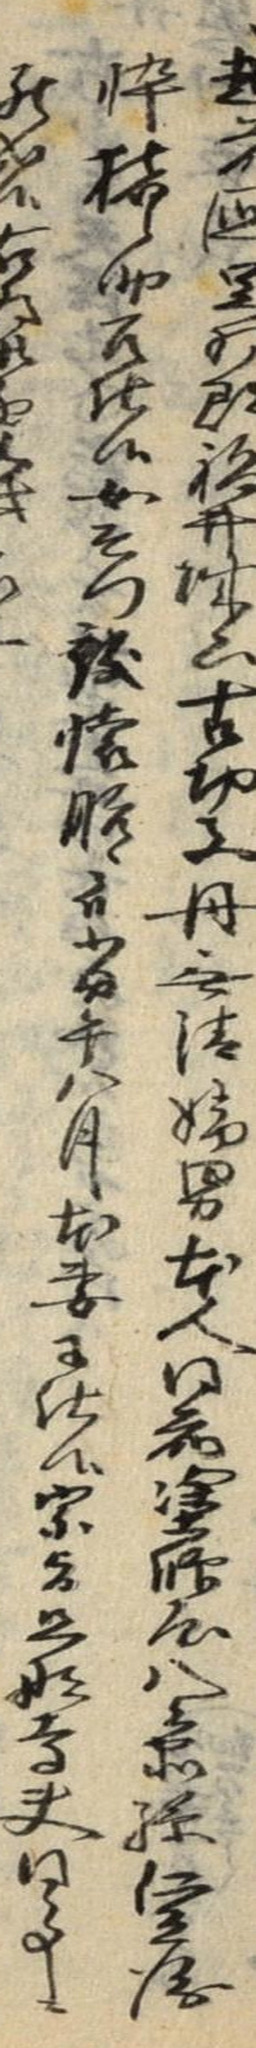忰猪之助召仕候女そつ致懐胎候に付当午八月本妻に仕候宗旨旦那寺夫同事に
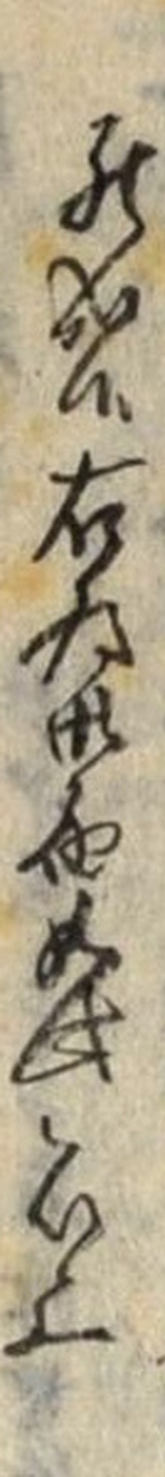罷成候右為御届如此候以上
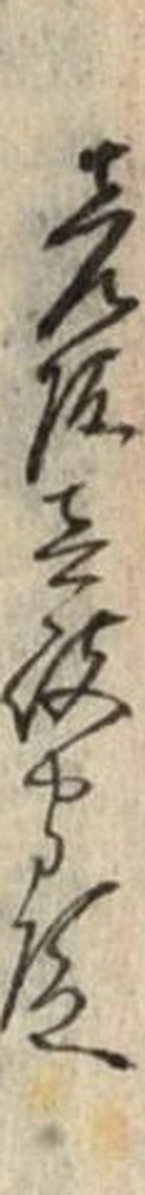彦坂壱岐守殿
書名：御停止異変死失
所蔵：福井県文書館 Fukui Prefectural Archives
